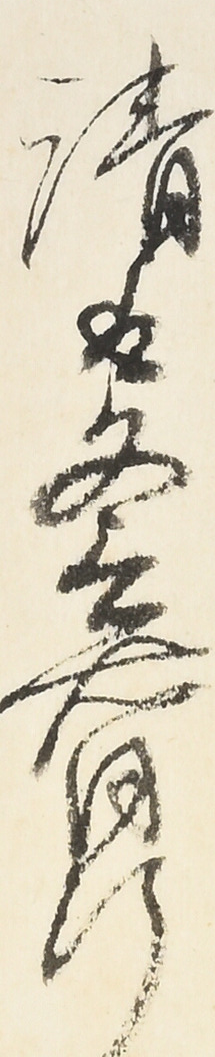請取文言右同断
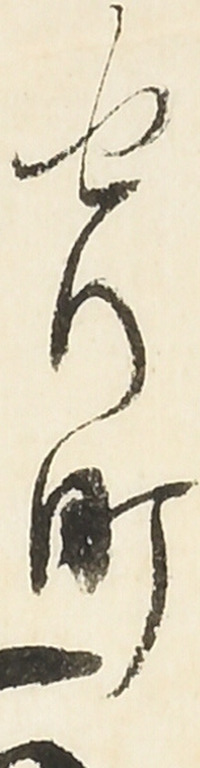せり町
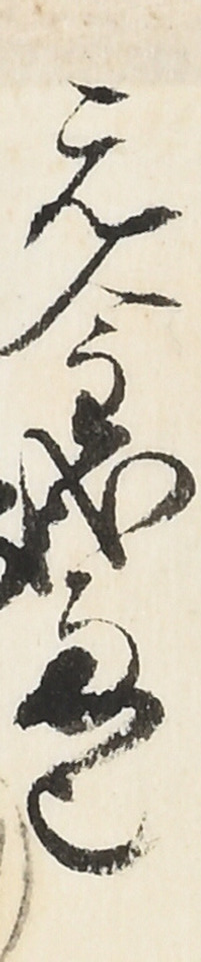元金壱両也
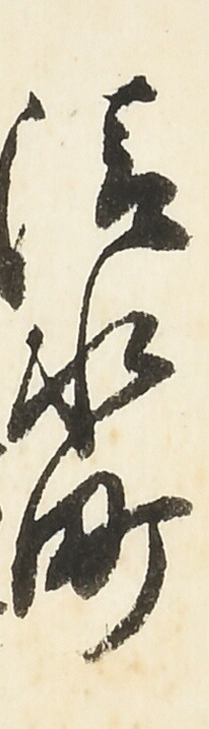清水町
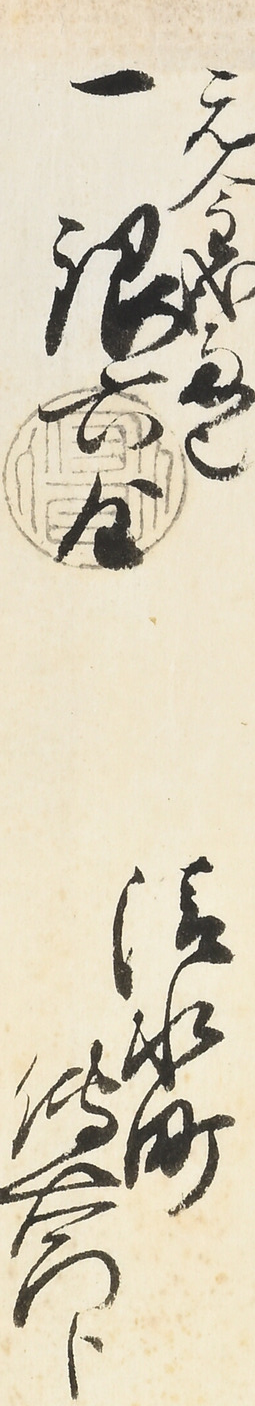一銀六匁伝右衛門分
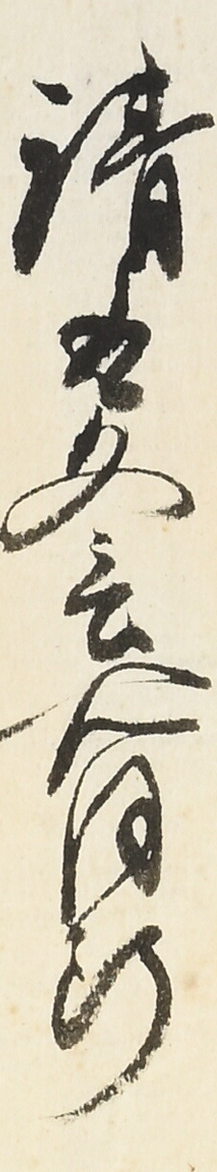請取文言右同断
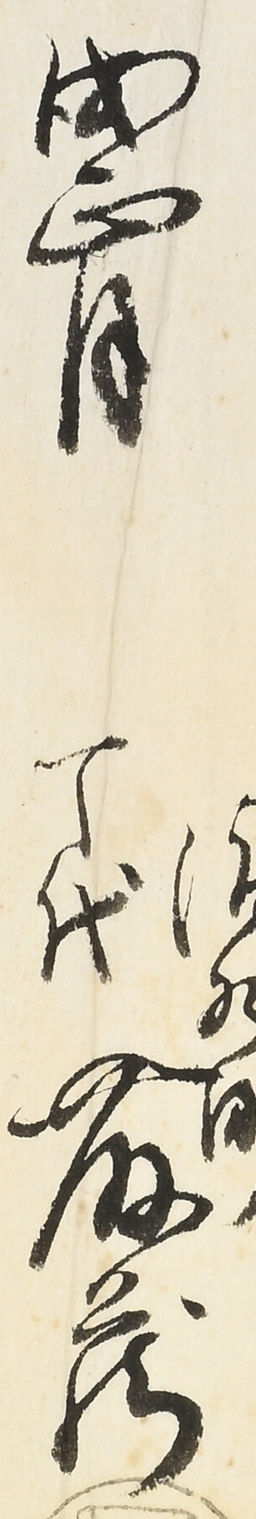戌正月丁代藤蔵
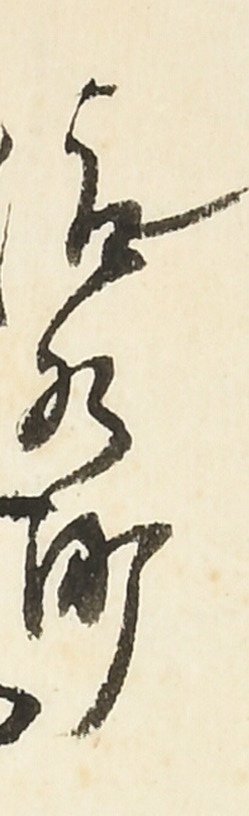清水町
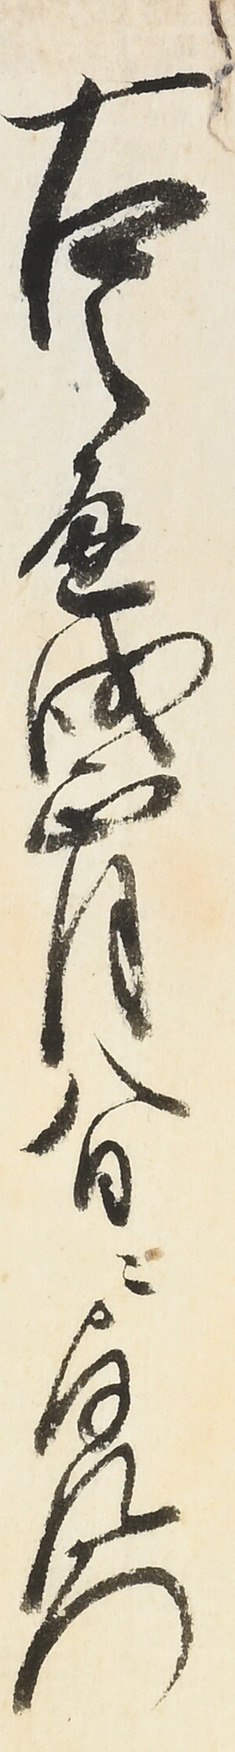右之通戌正月八日ニ与左衛門
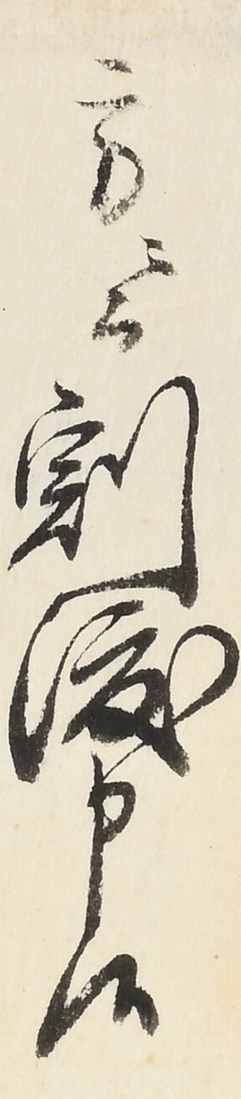方ニ而割渡申候
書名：御才覚金御利足割渡扣帳
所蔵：伊那市立高遠町図書館・合同会社AMANE
